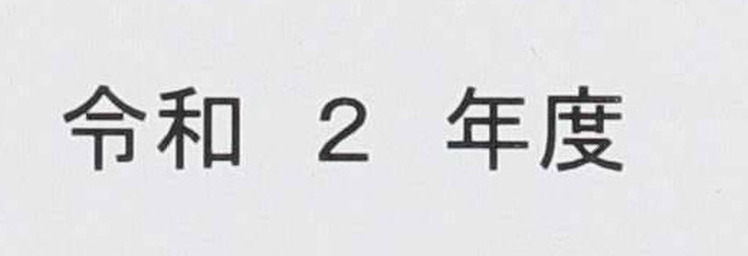令和２年度
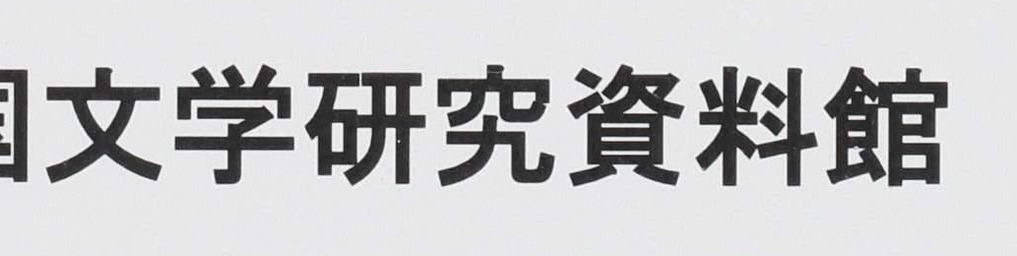国文学研究資料館
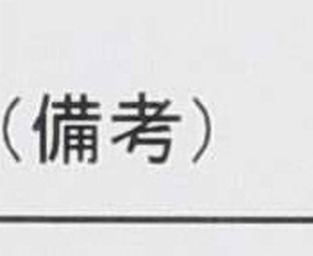(備考)
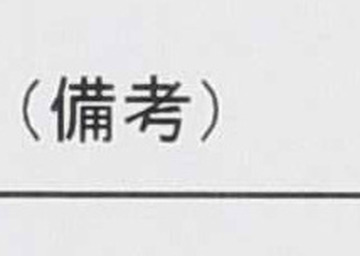(備考)
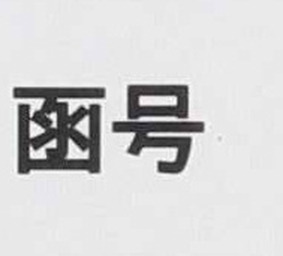函号:

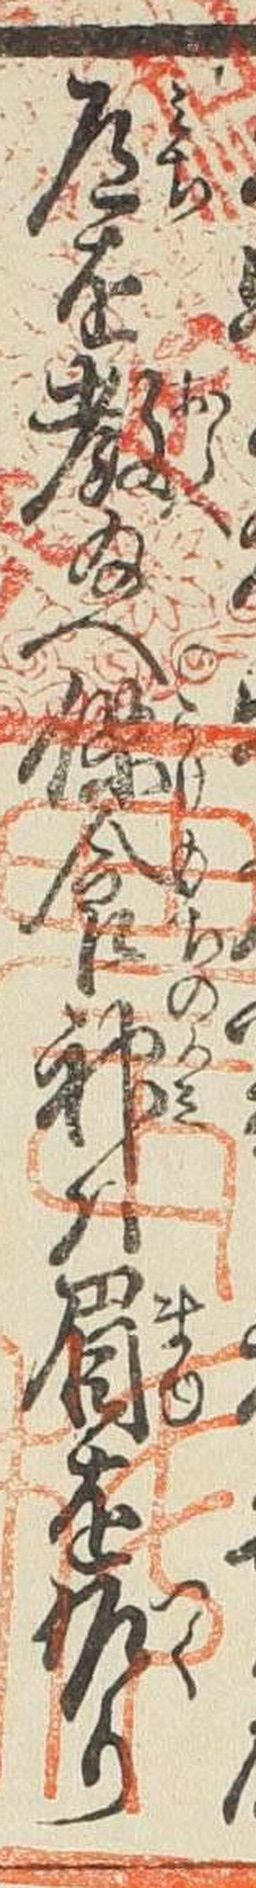道を教給へ。保食神は眉を作り
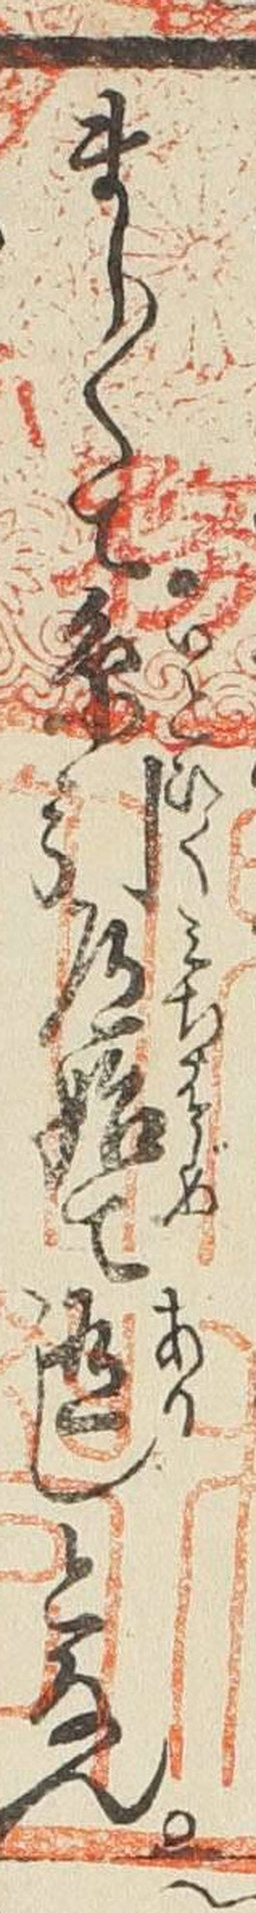まし〳〵て・糸道引始て有しとなん。
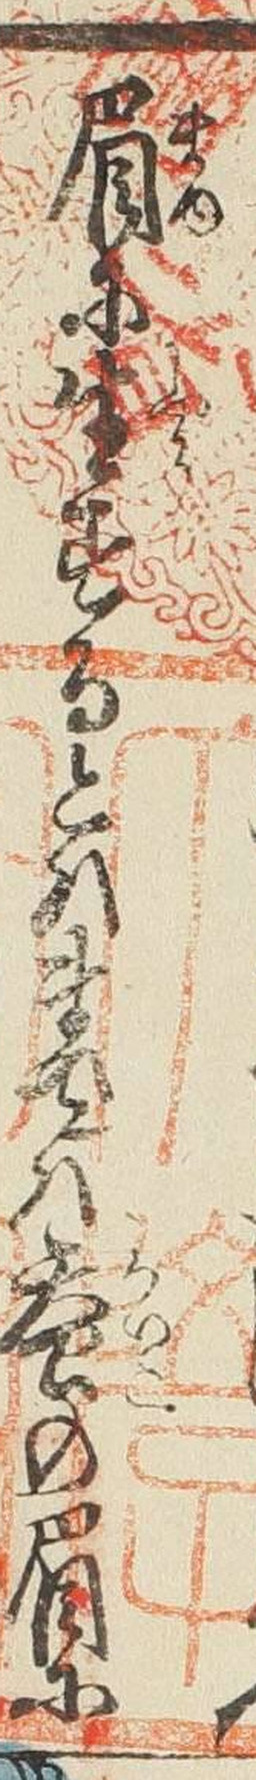眉に生するとはまゆは蚕の眉に
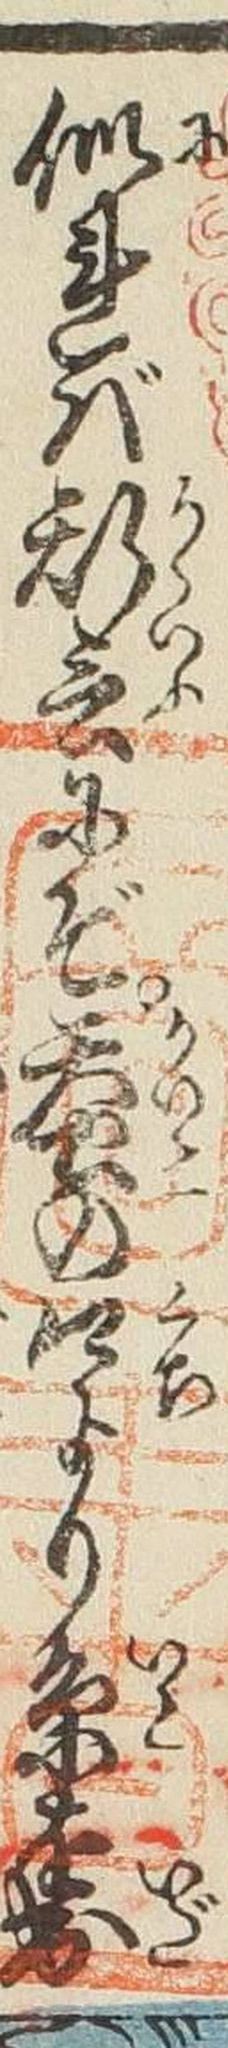似れば斯云にぞ。蚕の口より糸を出
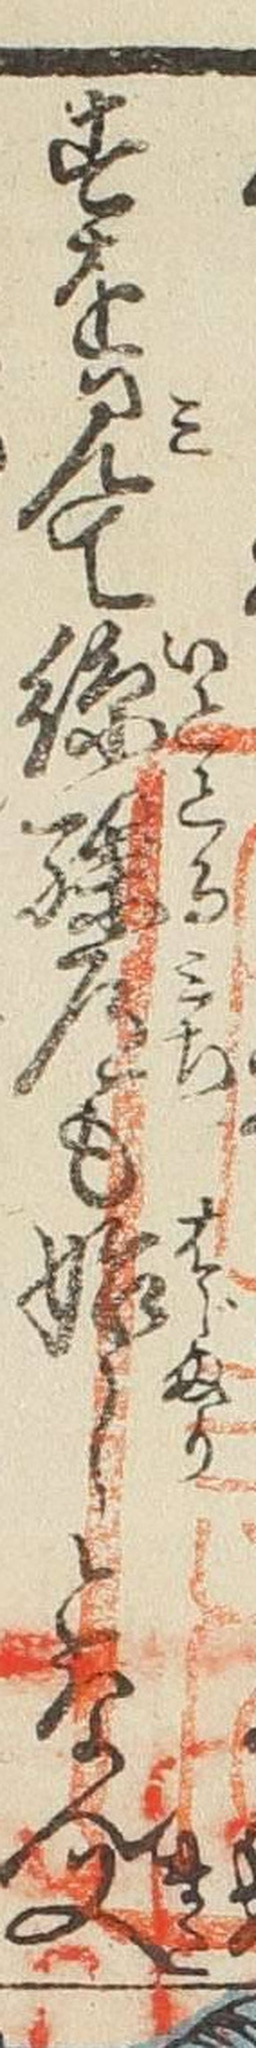すを見て糸繰道も始しとなん又
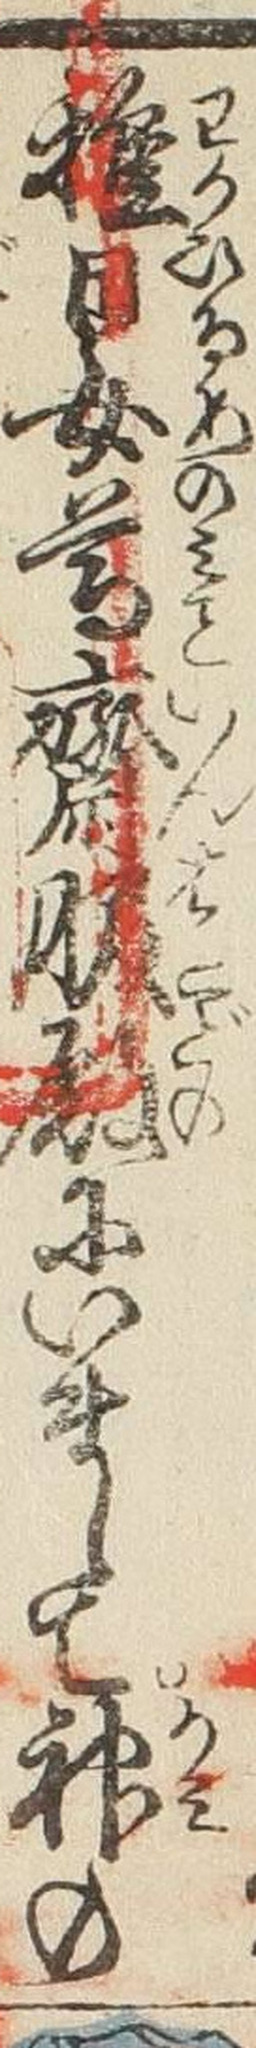稚日女尊斎服殿にいまして。神の
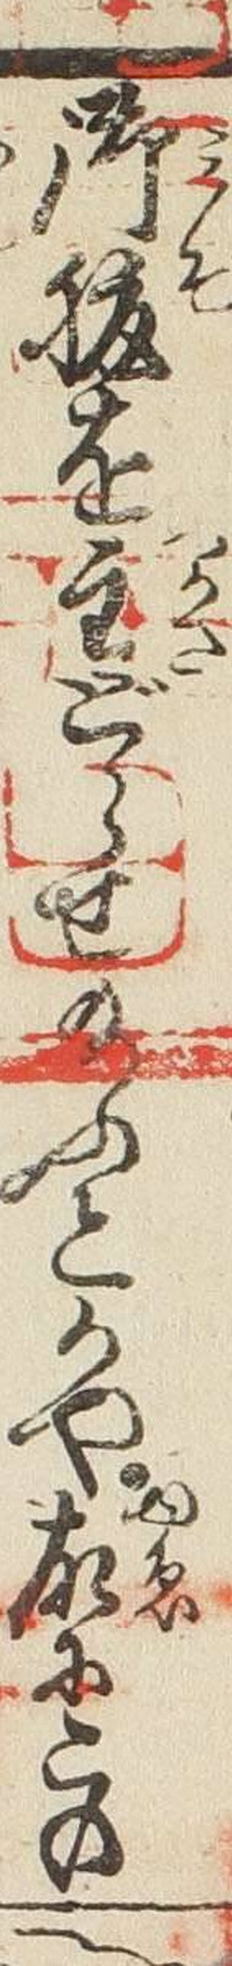御祓を主どらせ給ふとかや・故にこの
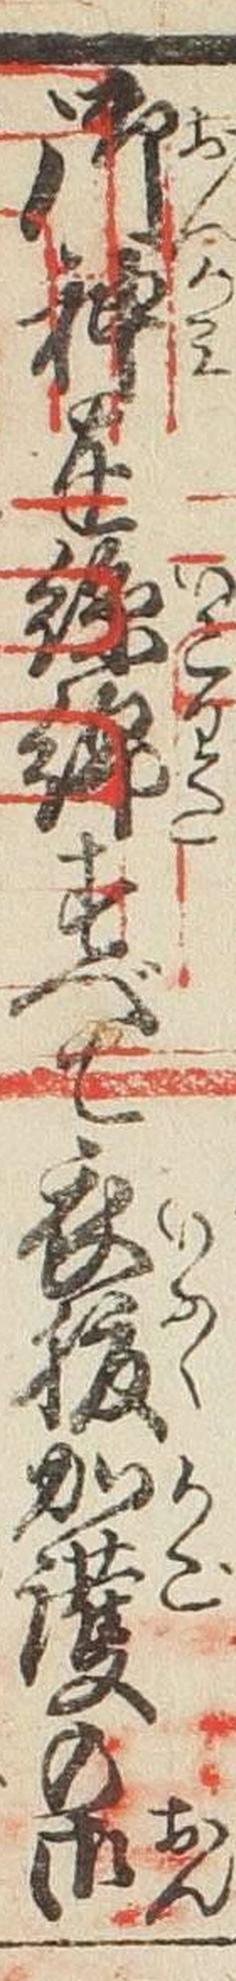御神を糸綿すべて衣服加護の御
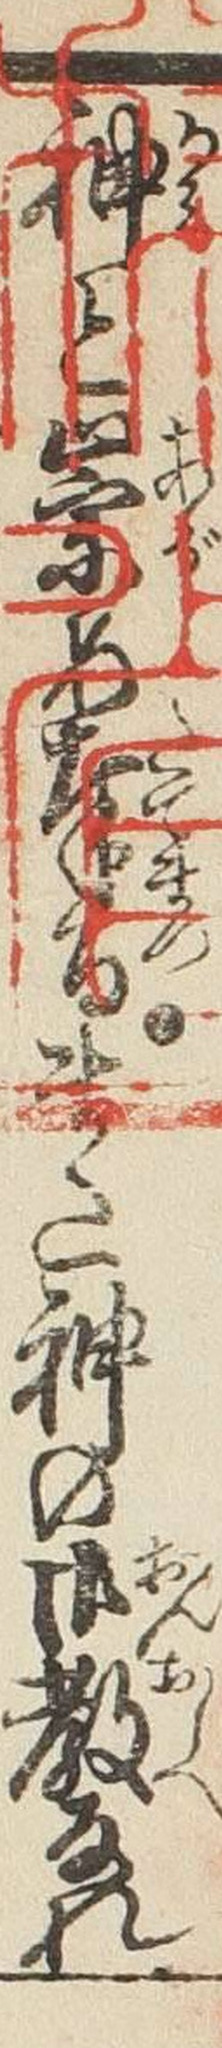神と崇め奉る・また神の御教なれ
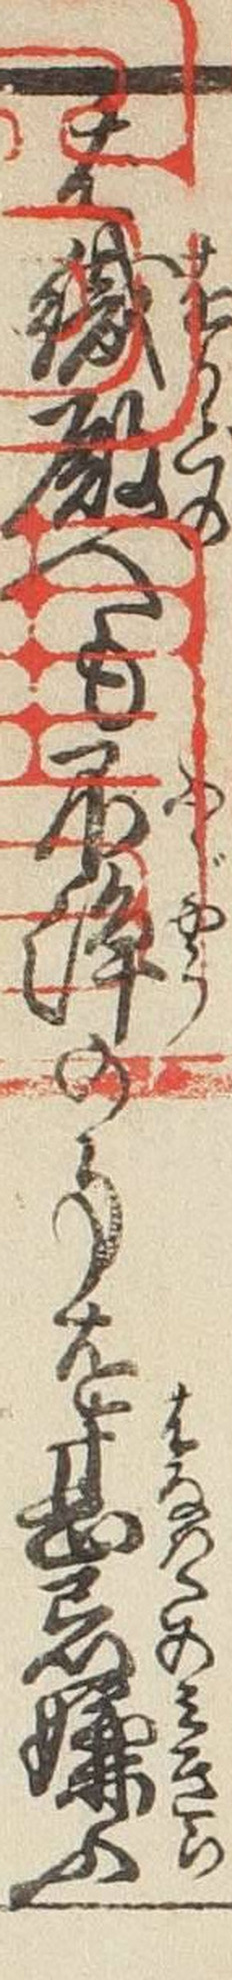ば織殿へも不浄の事を甚忌嫌ふ
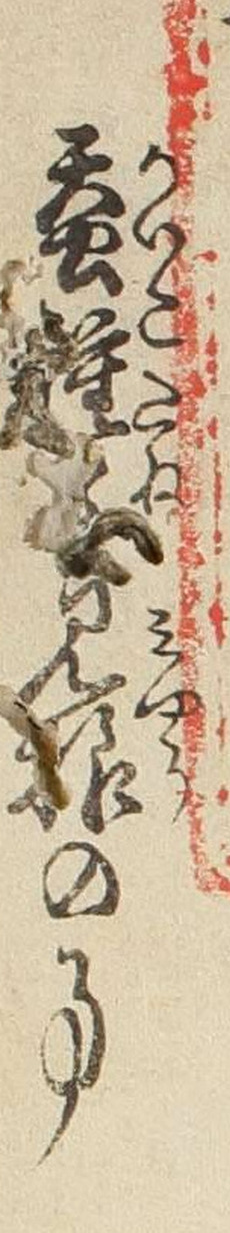蚕種子見様の事
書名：養蠶圖解
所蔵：東京大学農学生命科学図書館 国文学研究資料館
